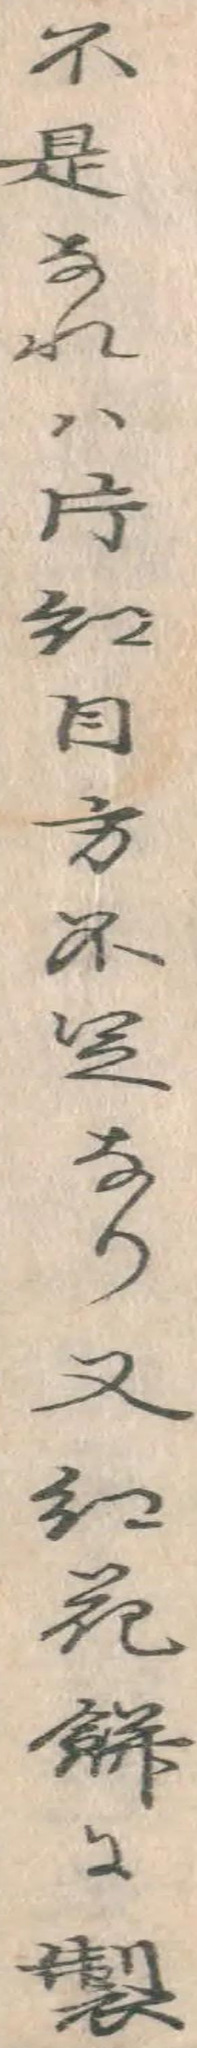不是なれは片紅目方不足なり又紅花餅に製

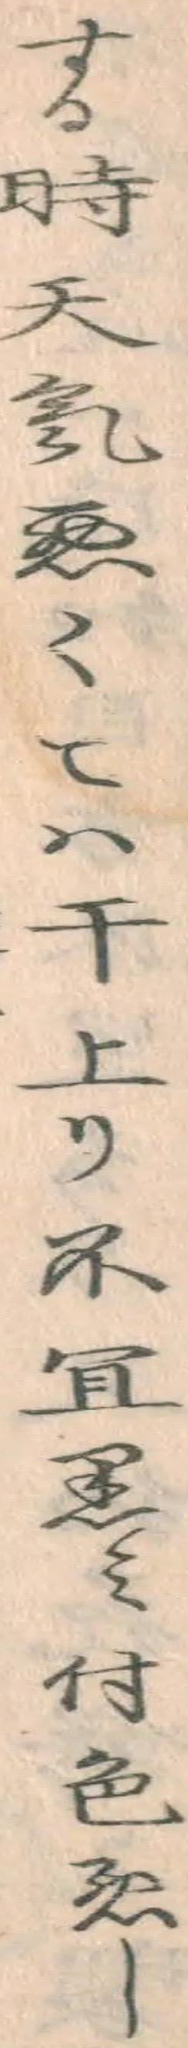する時天気悪くては干上り不宜黒み付色悪し
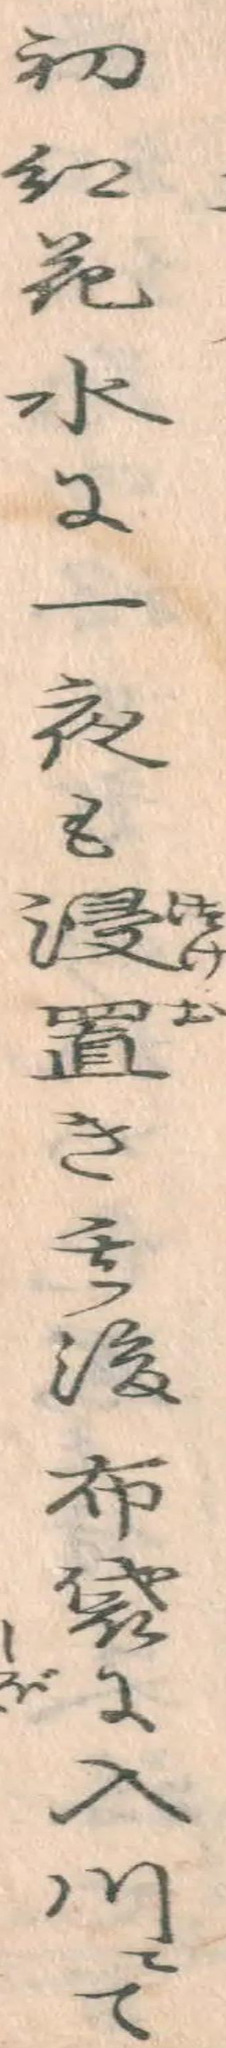一初紅花水に一夜も浸置き其後布袋に入川にて
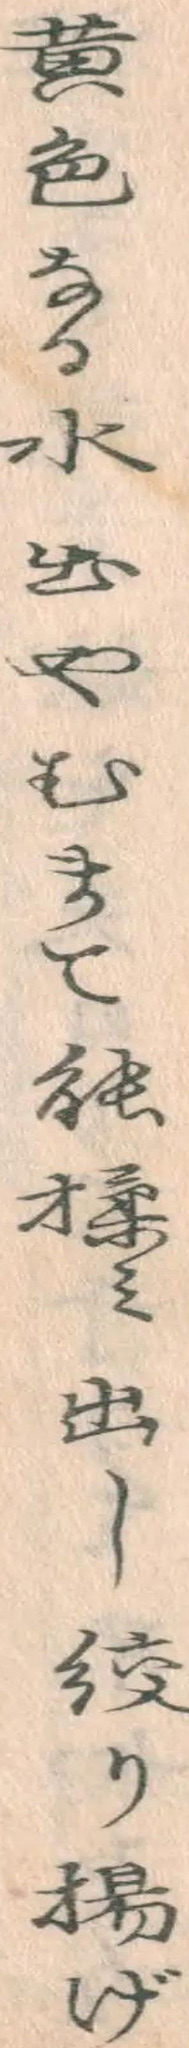黄色なる水出やむまて能揉み出し絞り揚げ
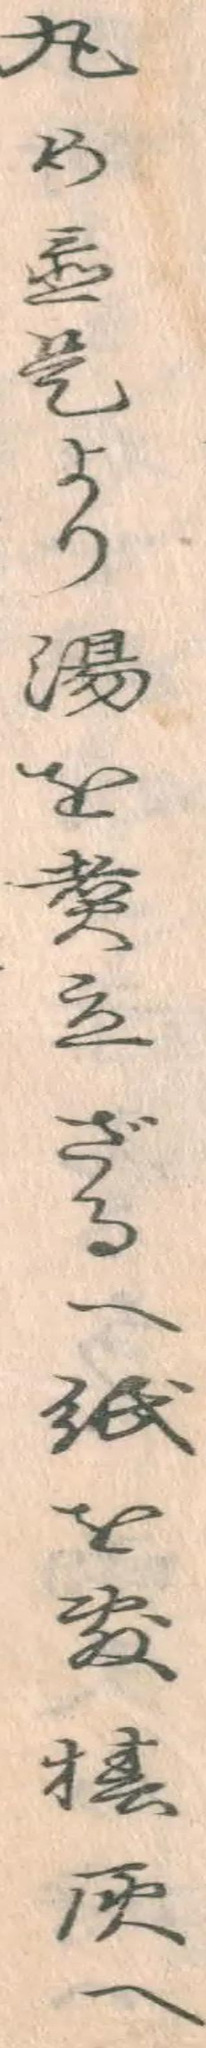丸め置是より湯を煮立ざるへ紙を敷椿灰へ
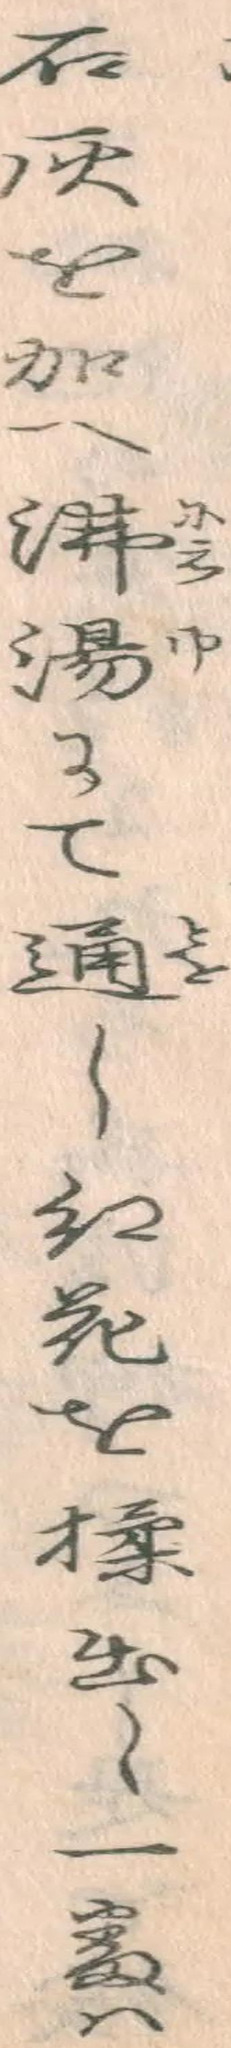石灰を加へ沸湯にて通し紅花を揉出し一番は
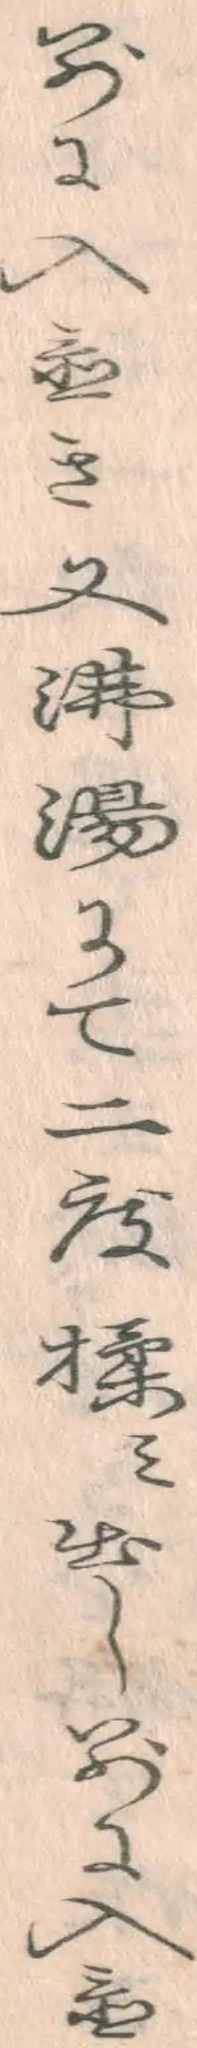別に入置き又沸湯にて二度揉み出し別に入置
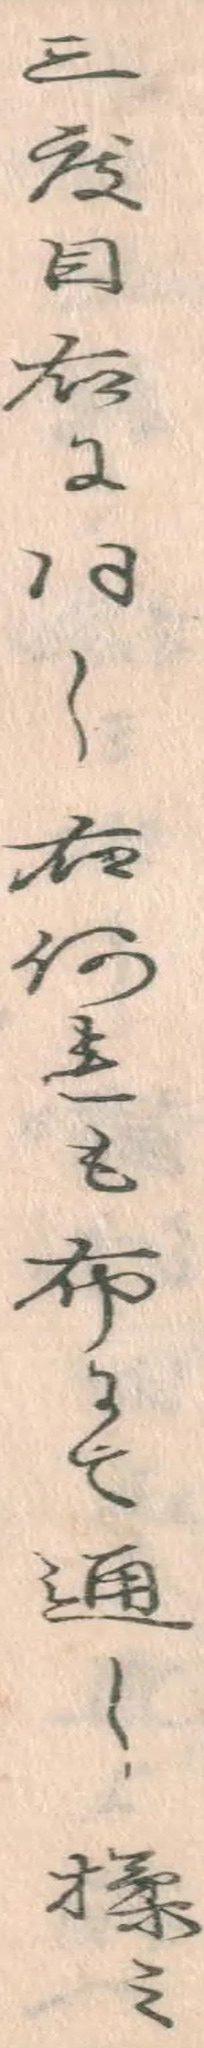三度目右に同し右何れも布にて通し揉み
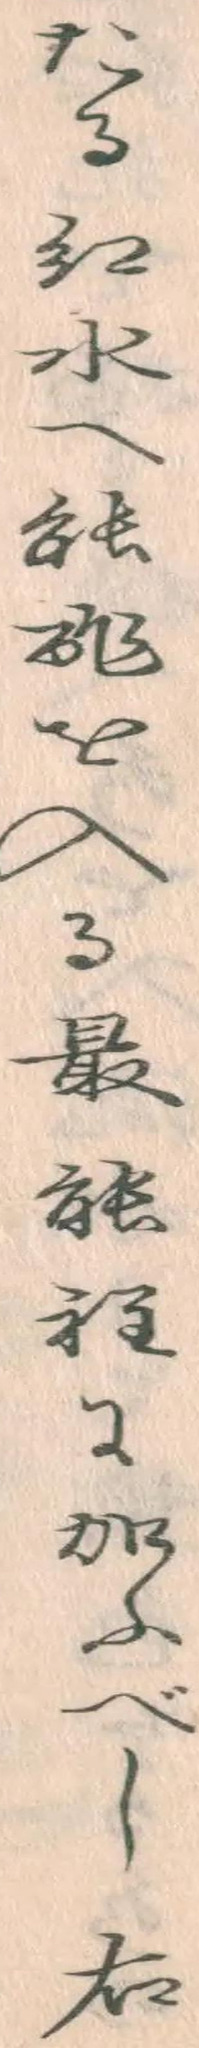たる紅水へ能酢を入る最能程に加ふべし右
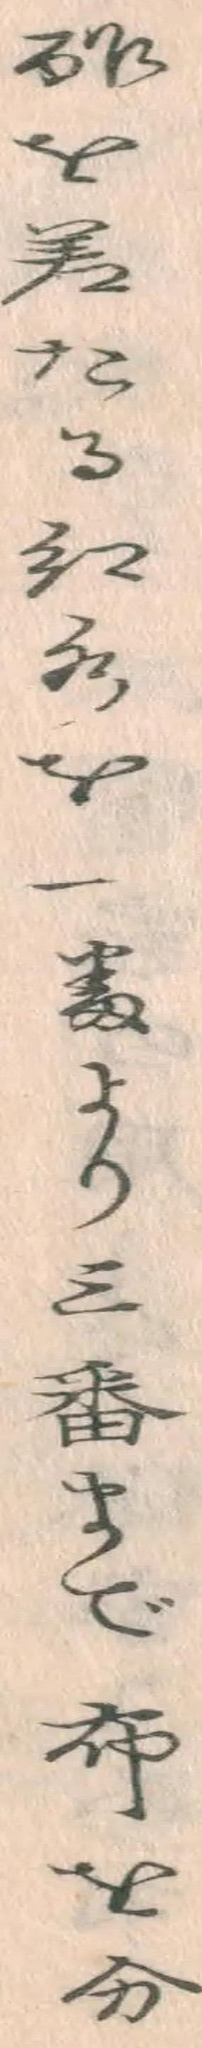酢を差たる紅水を一番より三番まで布を分
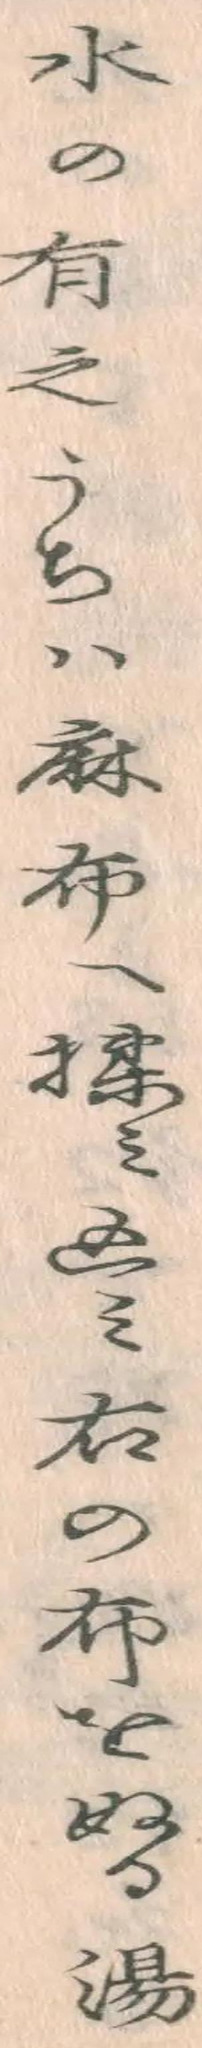水の有之うちは麻布へ揉み込み右の布をぬる湯
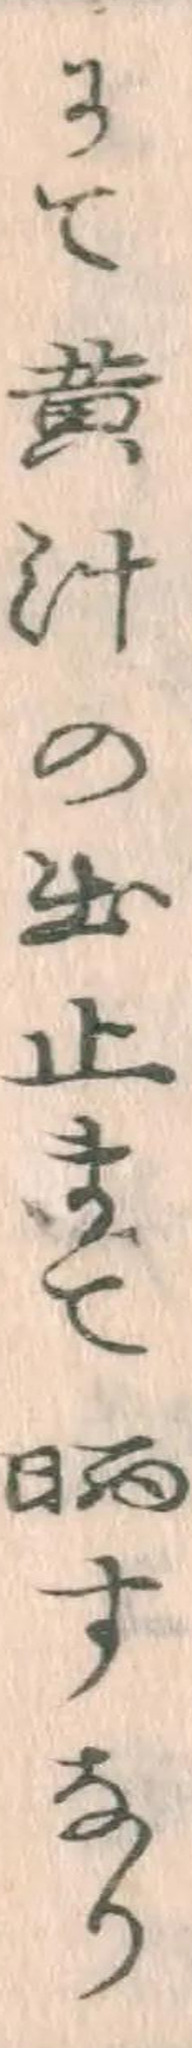にて黄汁の出止まて晒すなり
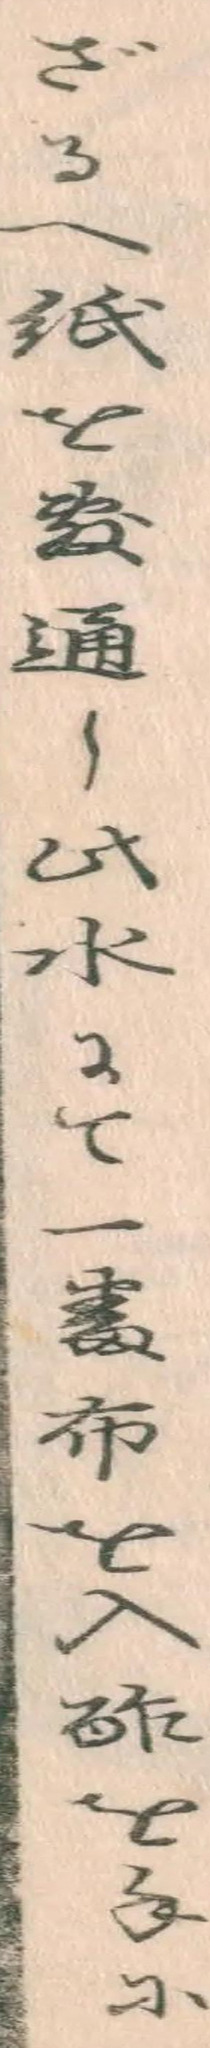ざるへ紙を敷通し此水にて一番布を入酢を手に
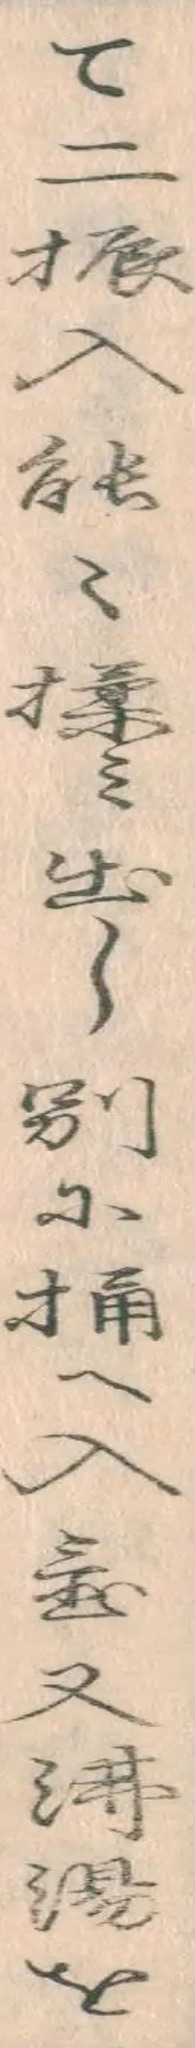て二振入能々揉み出し別に桶へ入置又沸湯を
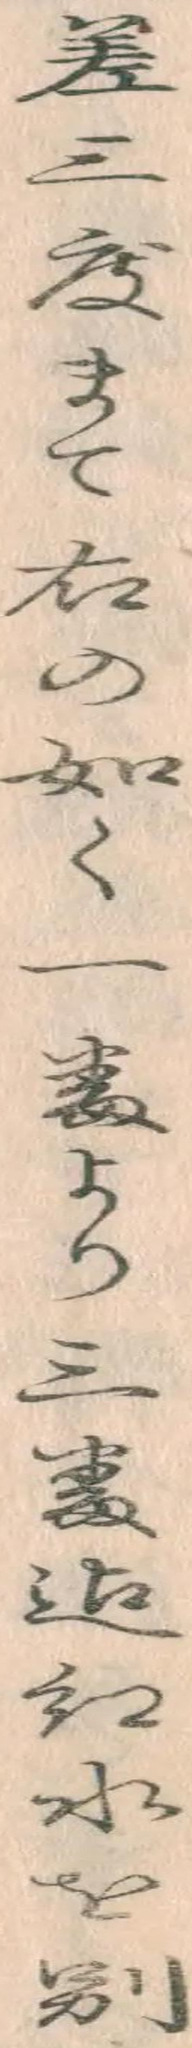差三度まて右の如く一番より三番迄紅水を別
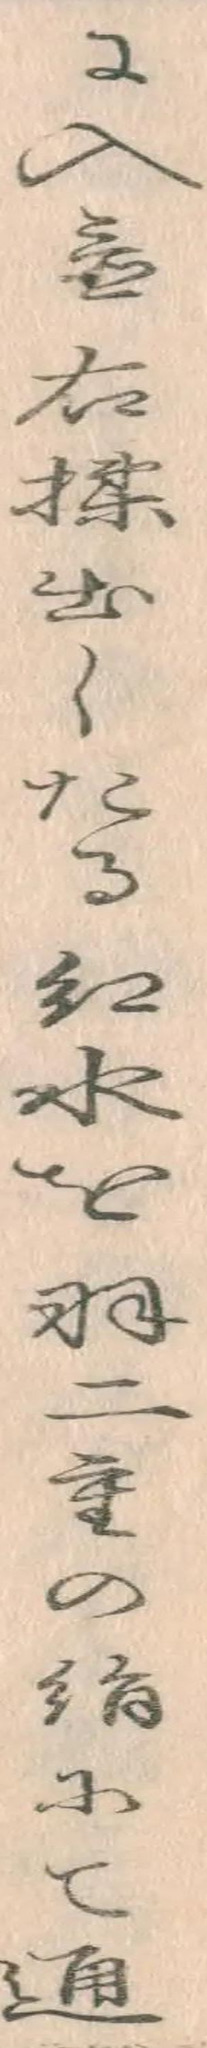に入置右揉出したる紅水を羽二重の絹にて通
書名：機織彙編 5巻. [1]
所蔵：国立国会図書館 National Diet Library, JAPAN
